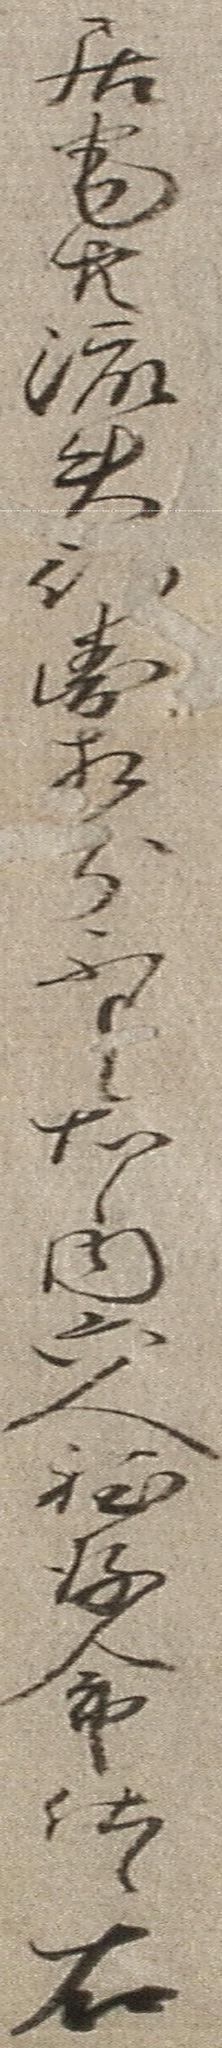居宅共流失行衛相分不申候右之内六人程存命仕候右
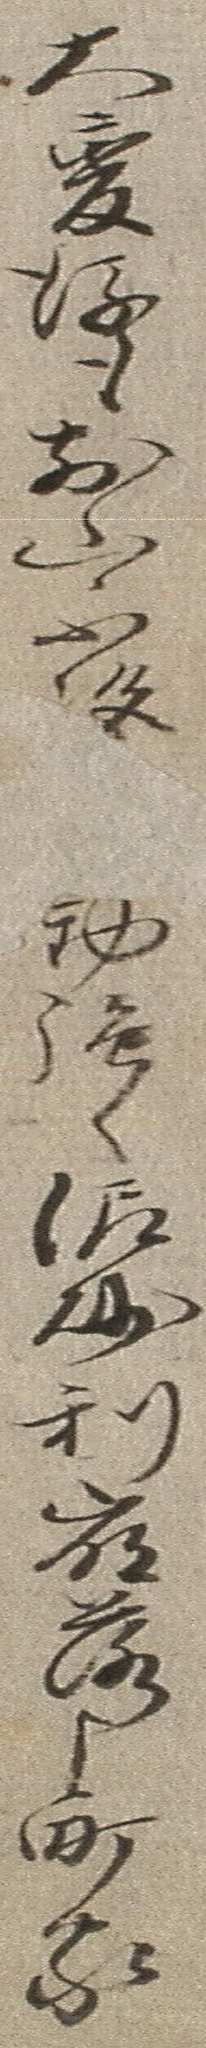大変後も前山不絶震動強く泥砂利崩落申候町家
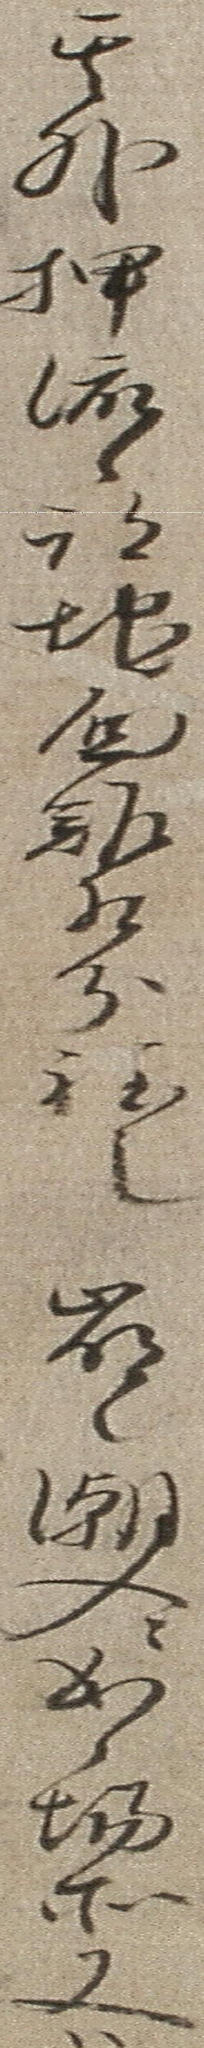其外押流候跡地面難相分程申候崩し潮入に成候場所又は
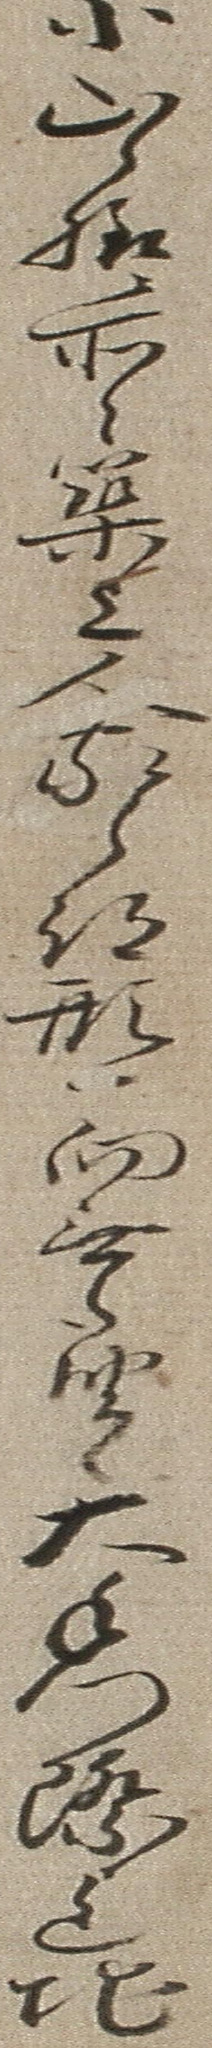小山之様に所々築上人家跡形は向無御座候大手門際迄地
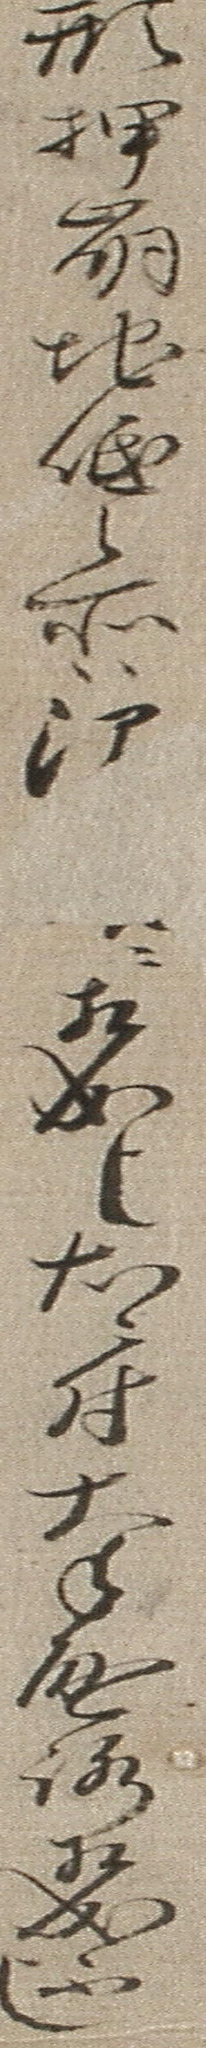形押崩地低候之所は泥に相成申候右に付大手通路相成不申候
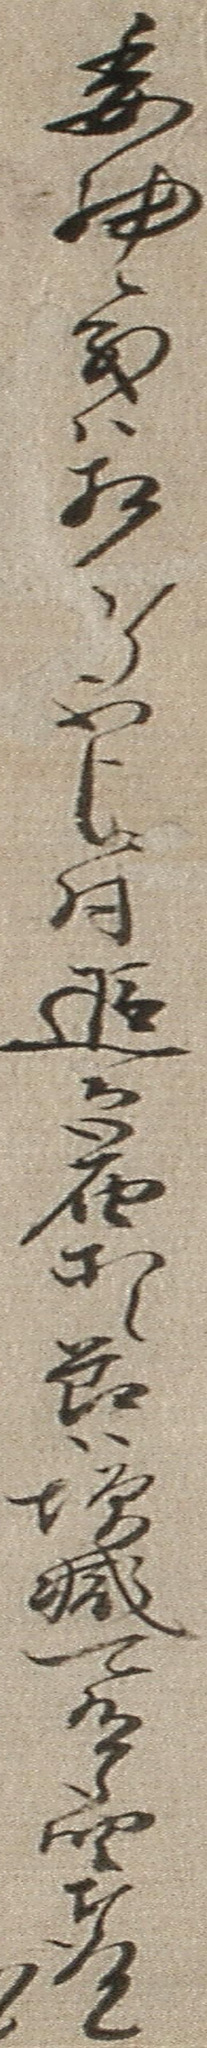委細之義は相分不申候に付追而御届等之節は増減可有御座奉存候以上
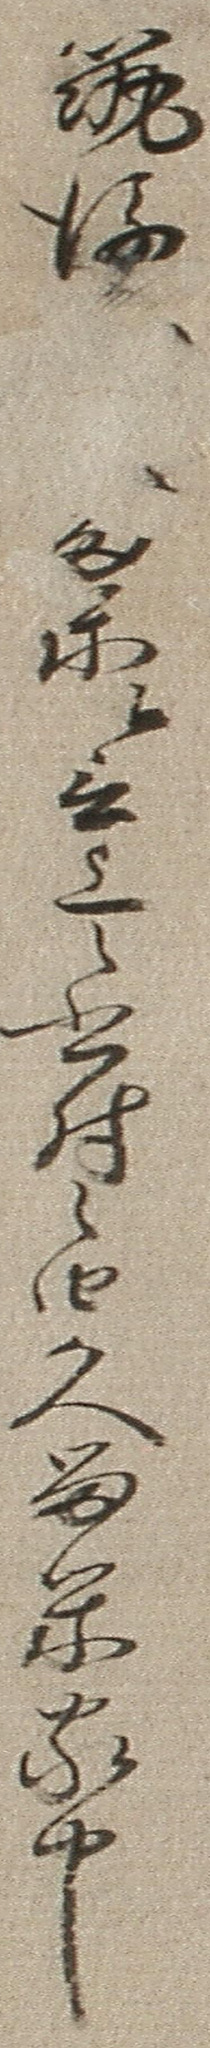筑後久留米江言上之書付之由久留米家中
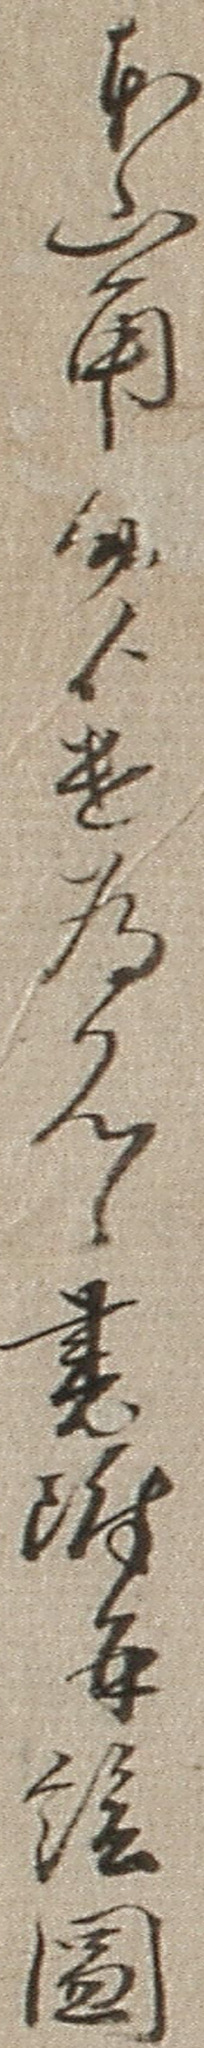本山角助ゟ遣為見候書附并絵図
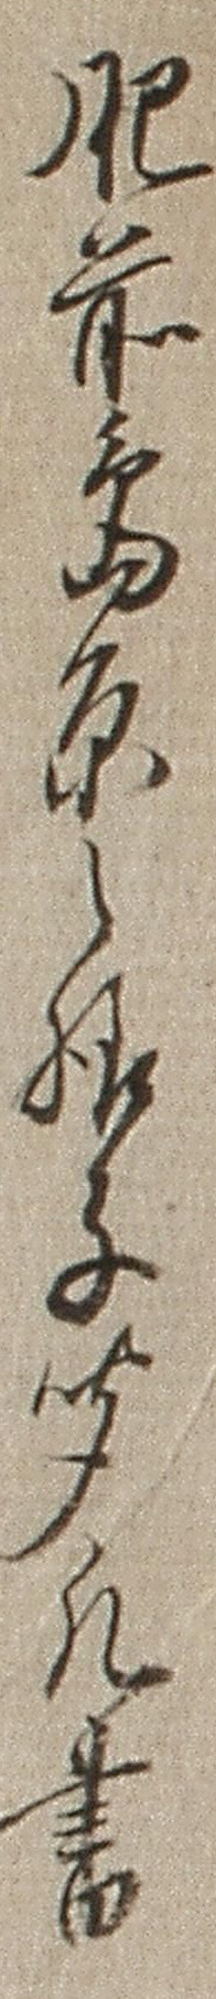肥前島原之様子聞凡書
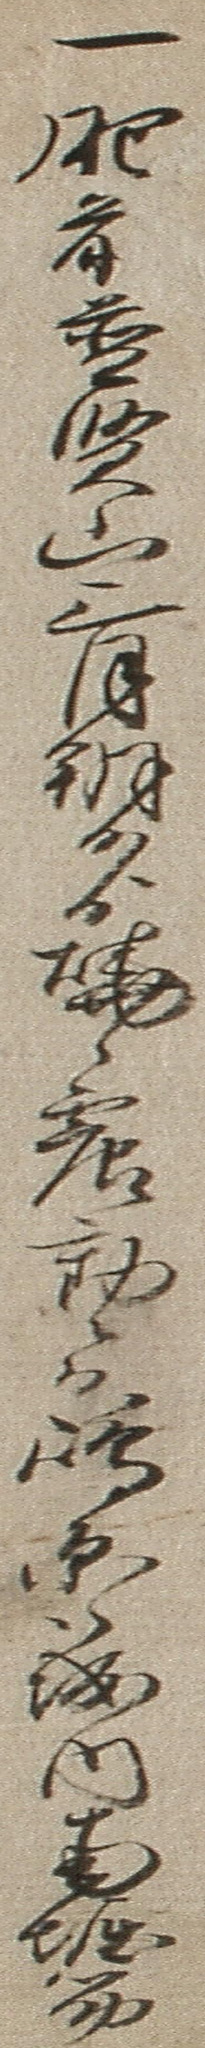一肥前普賢山三月朔日ゟ焼候震動に而嶋原御城内南堀筋
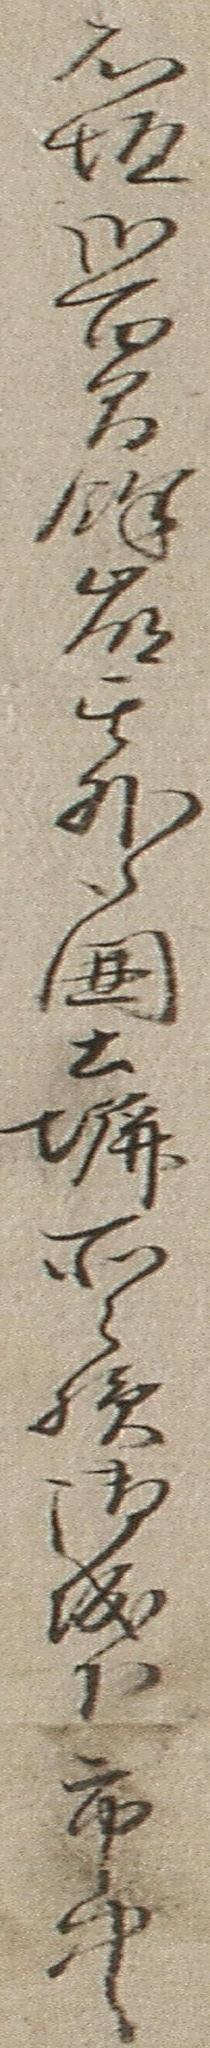石垣弐百間余崩其外御囲土塀所々損御城市中下

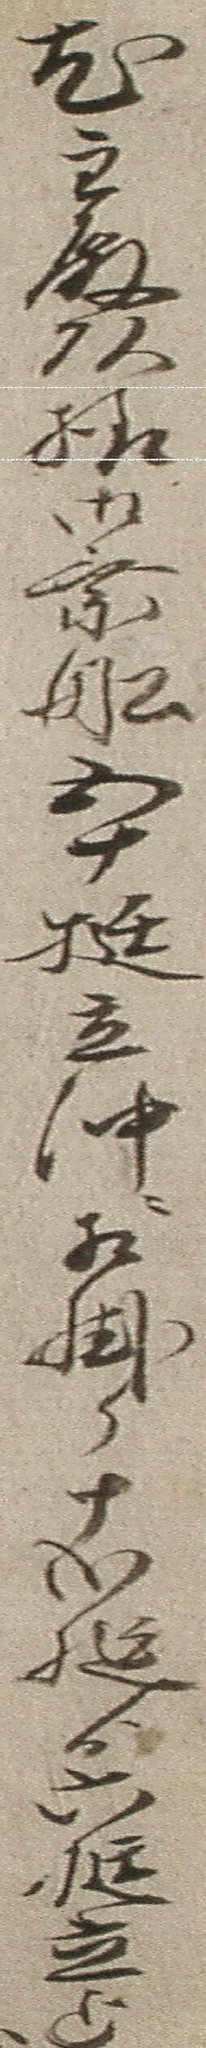尤主殿頭様御乗船五十挺立沖相掛り十弐挺ゟ六挺立迄は
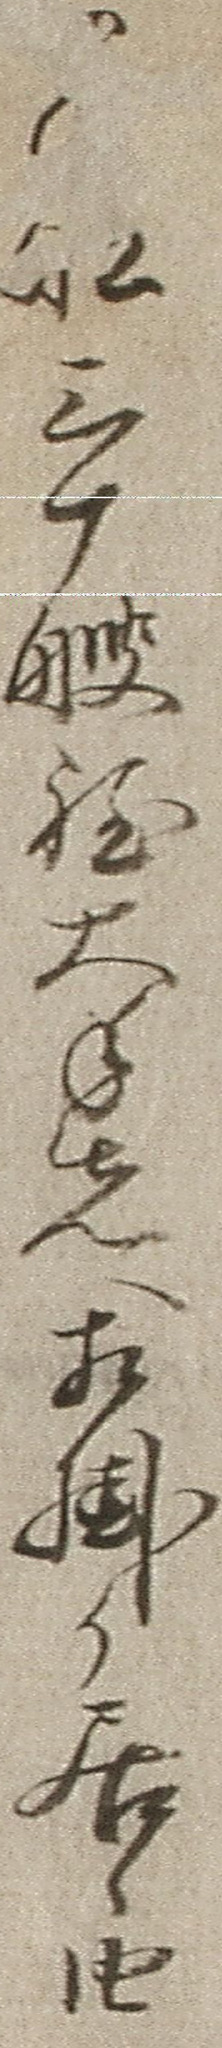船三十艘程大手先へ相掛り居候由
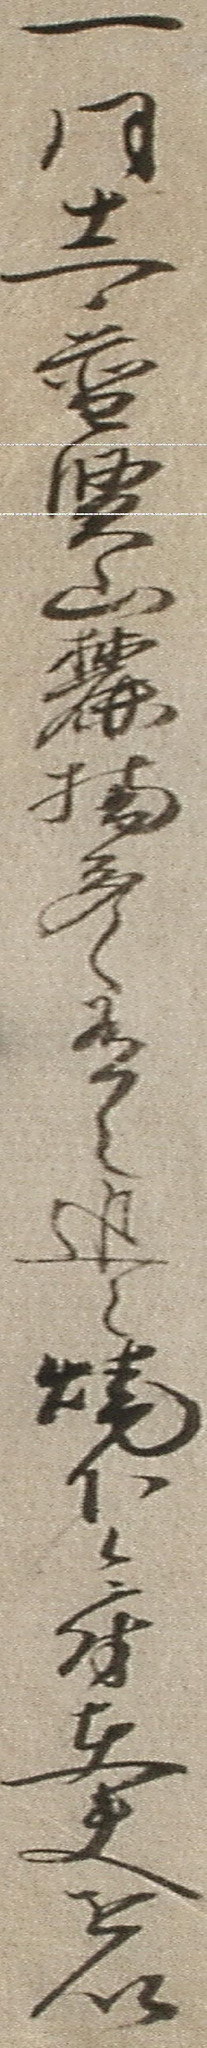一同十二日普賢山麓楠多く有之追々焼下候に付在夫を以
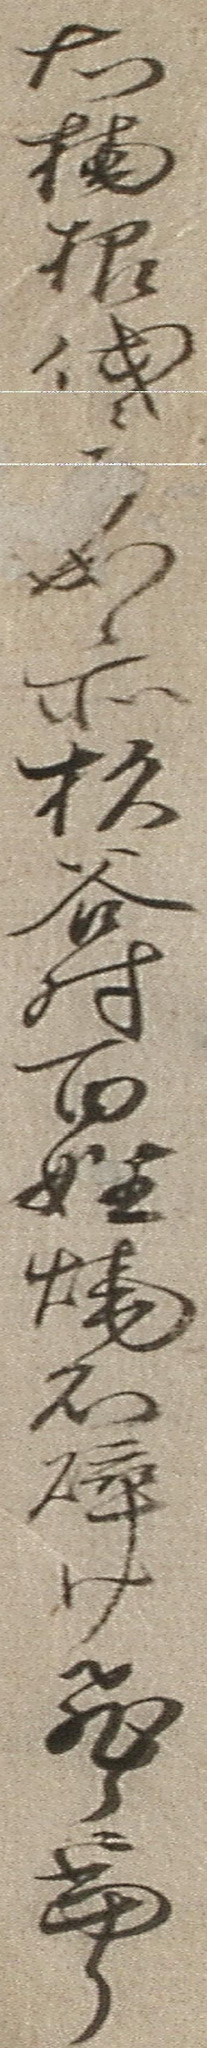右楠根伐に相成候所杉谷村百姓焼石砕け飛候に当り
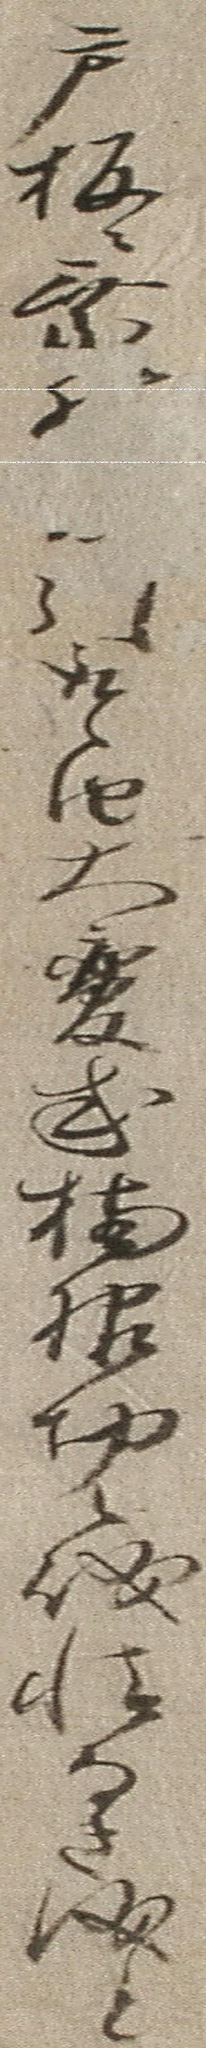戸板に乗引取候由大変成楠根切候儀情なき儀と
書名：太平秘録抜書　浅間山燒及普賢山崩
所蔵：東京大学地震研究所図書室 Earthquake Research Institute Library, The University of Tokyo, JAPAN
